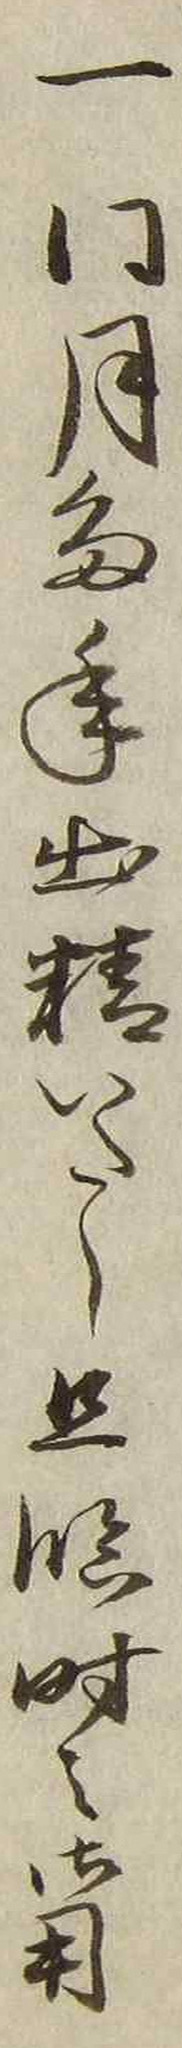一同月多年出精いたし且臨時之御用

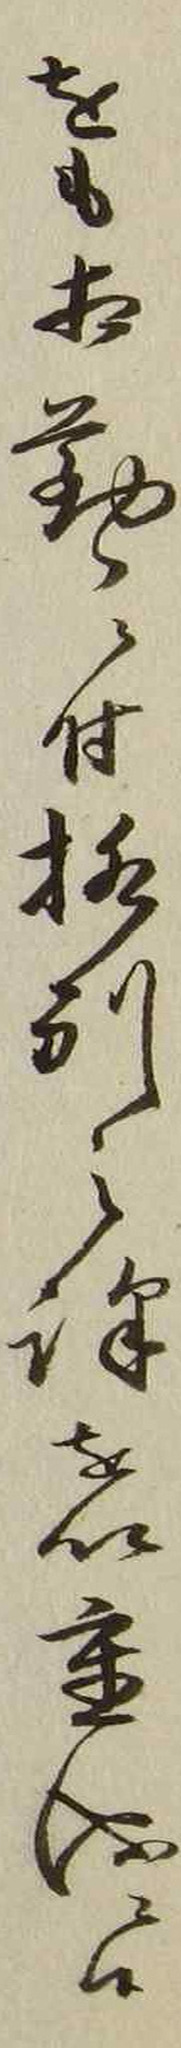をも相勤候ニ付格別之訳を以重儀ニ候
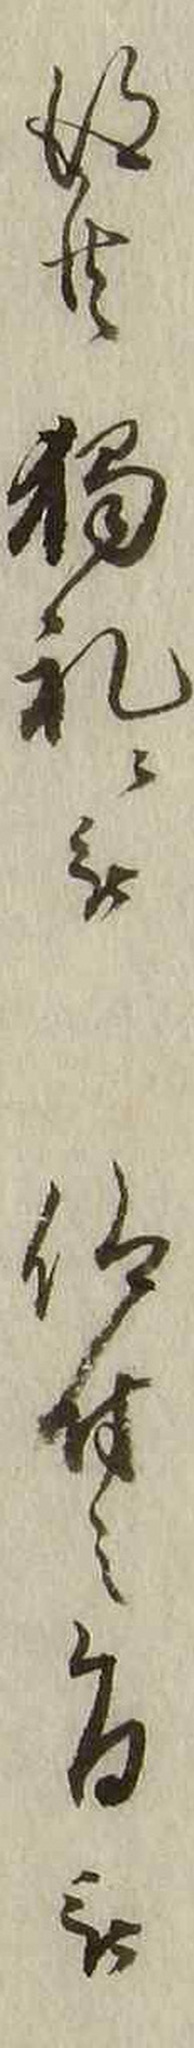得共独礼ニ被仰付之旨被
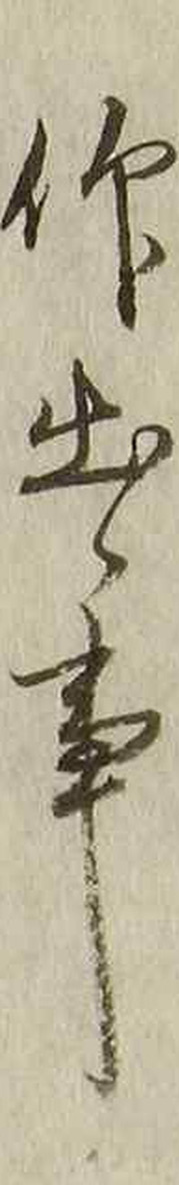仰出候事
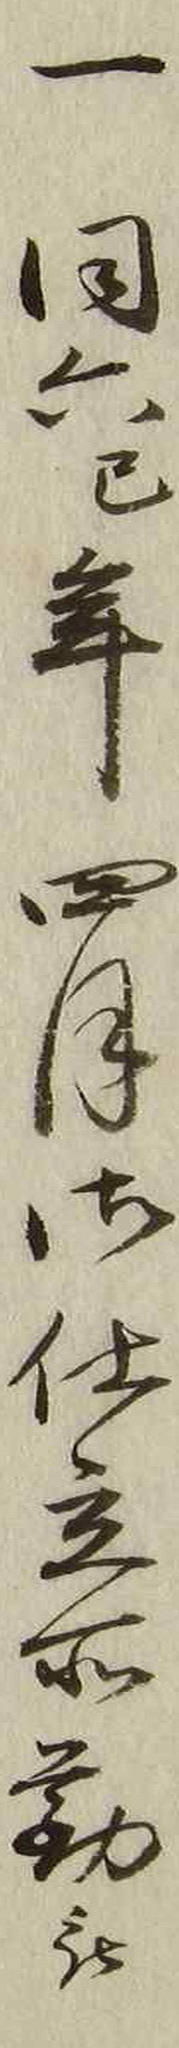一同六巳年四月御仕立所勤被
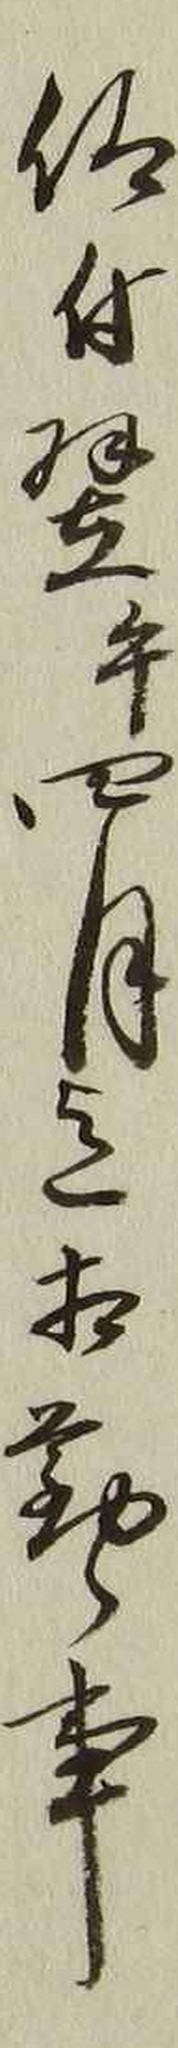仰付翌午四月迄相勤候事
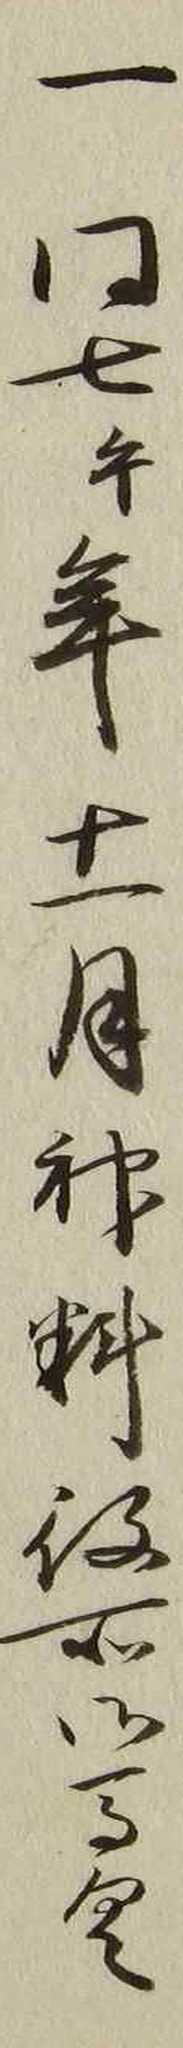一同七午年十一月神料役所御馬具
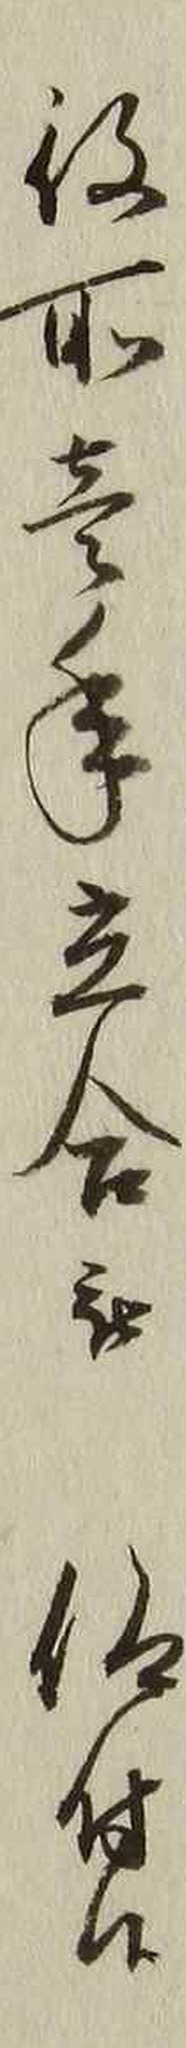役所壱年立合被仰付候
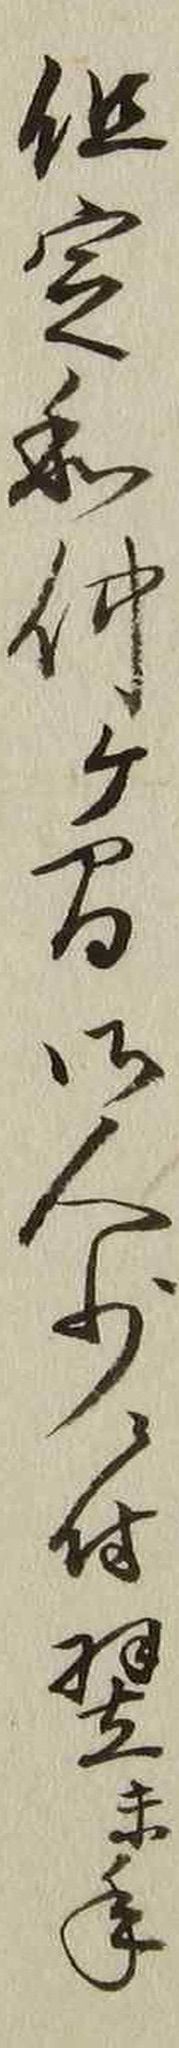但定和仲ケ間御人少ニ付翌未年
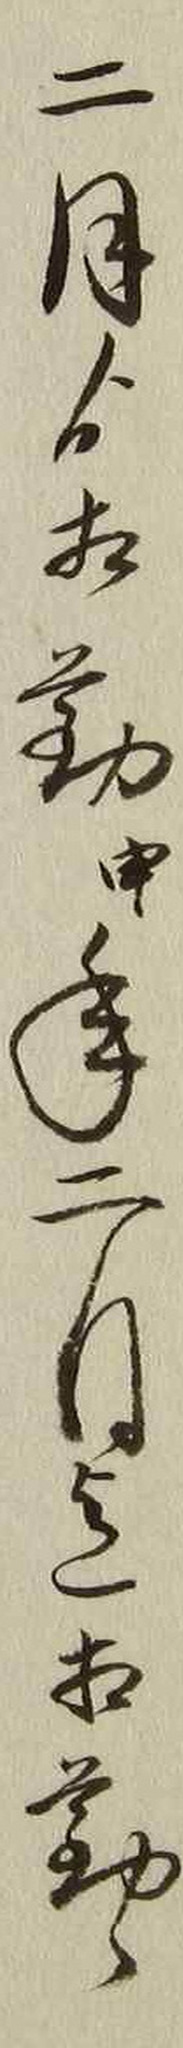二月ゟ相勤申年二月迄相勤候
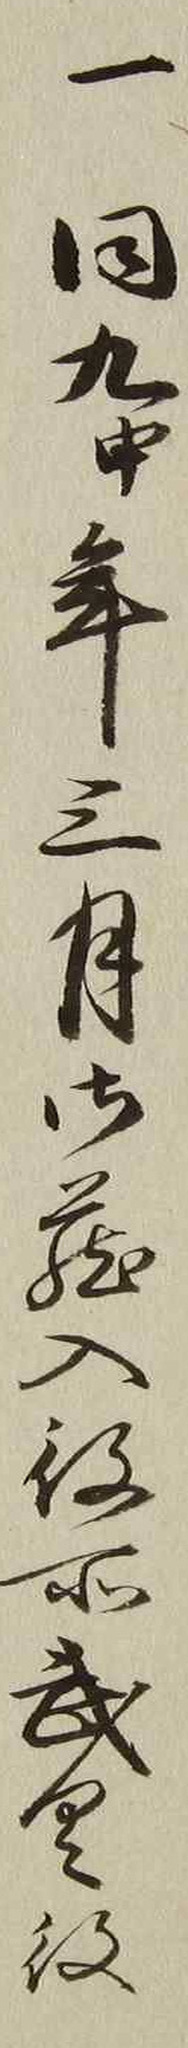一同九申年三月御蔵入役所武具役
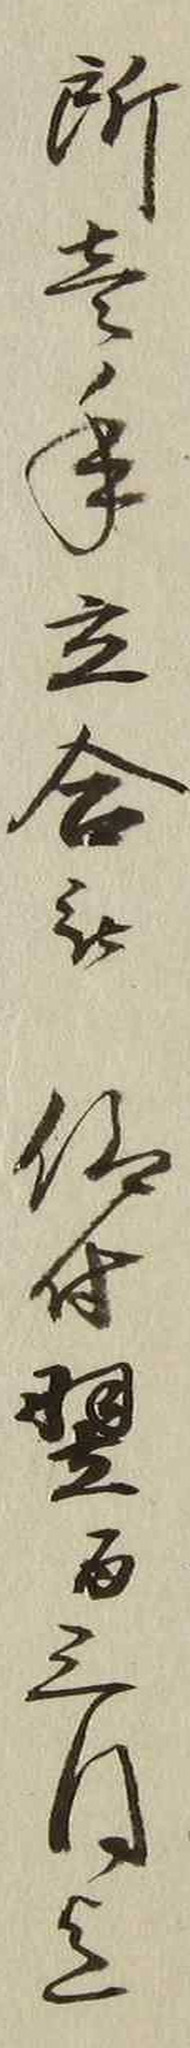所壱年立合被仰付翌酉三月迄
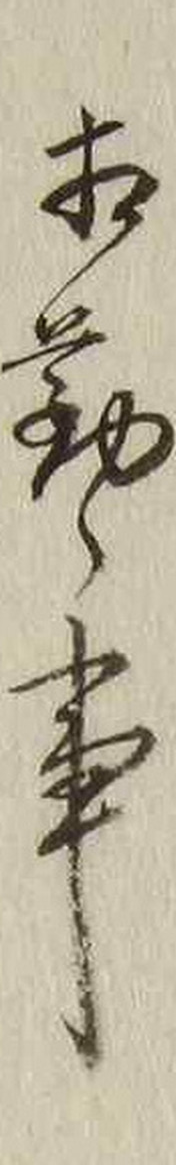相勤候事
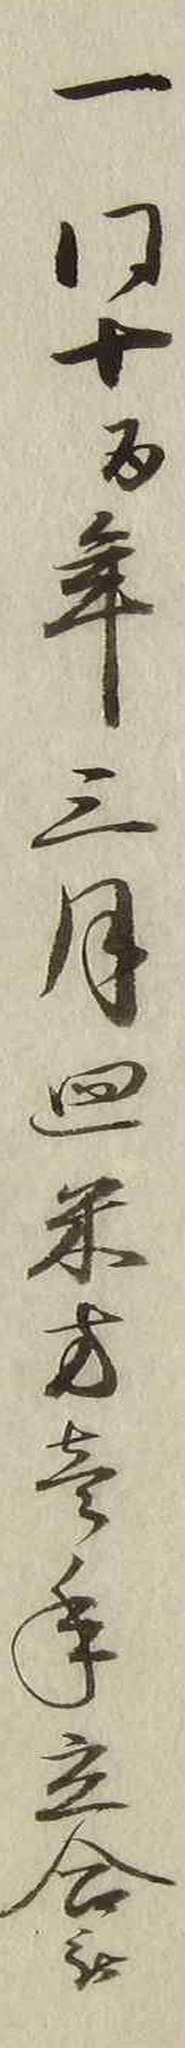一同十酉年三月廻米方壱年立合被
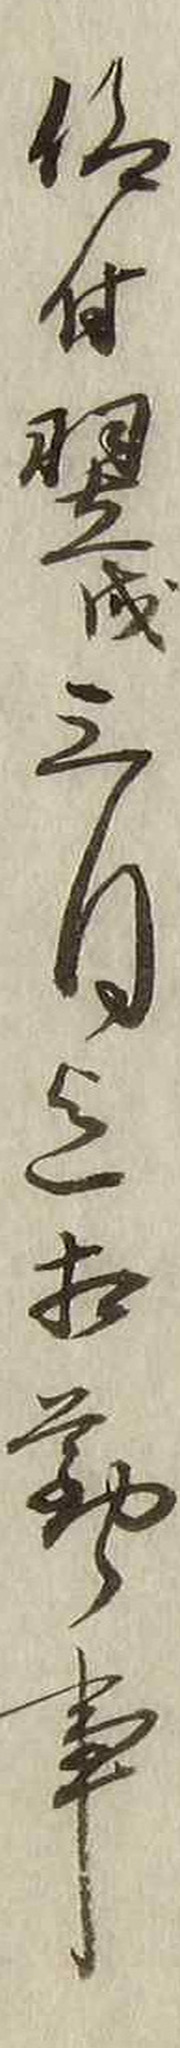仰付翌戌三月迄相勤候事
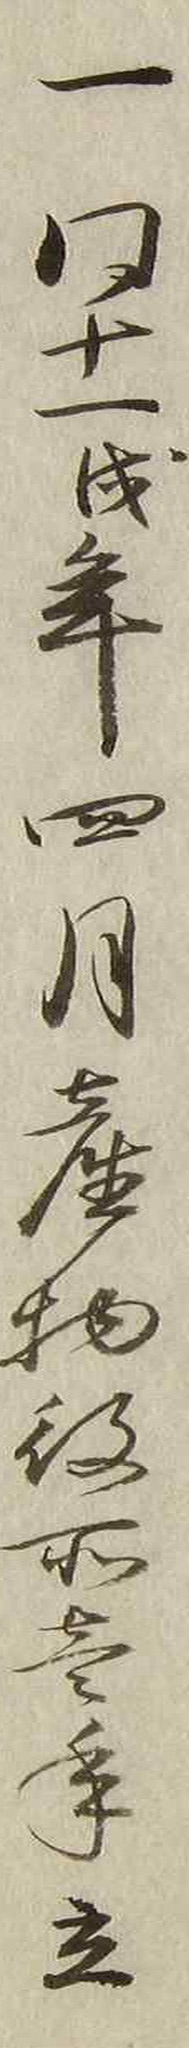一同十一戌年四月産物役所壱年立
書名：諸士系譜　巻之102　か之部10
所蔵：会津若松市立会津図書館
